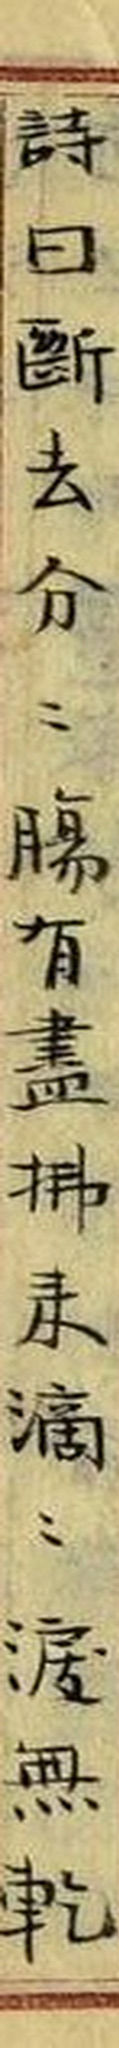詩曰斷去分々膓有盡拂来滴々涙無乾
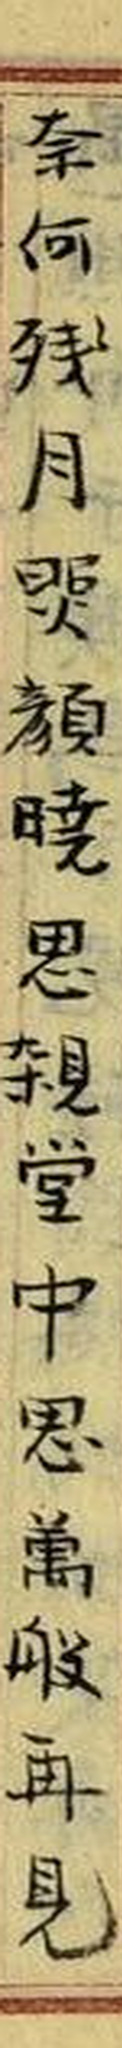奈何残月𤋜顔暁思視堂中思萬般再見
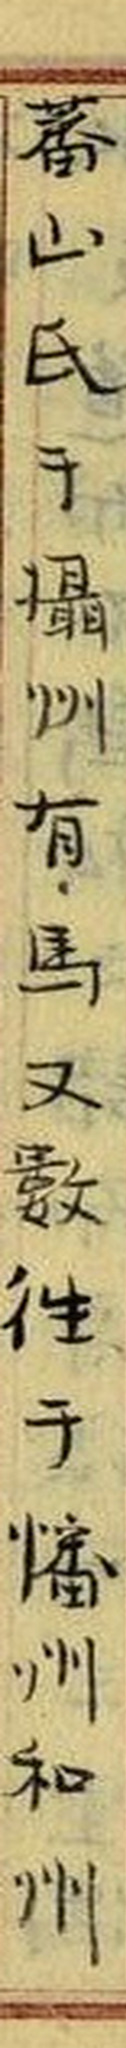蕃山氏于攝州有馬又數往于播州和州
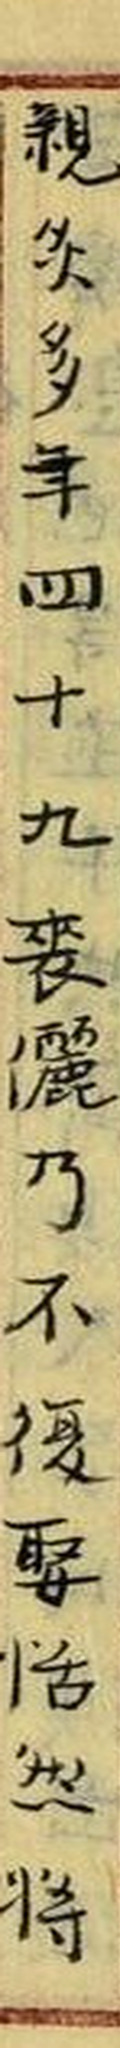親炙多年四十九䘮儷乃不復娶恬然将
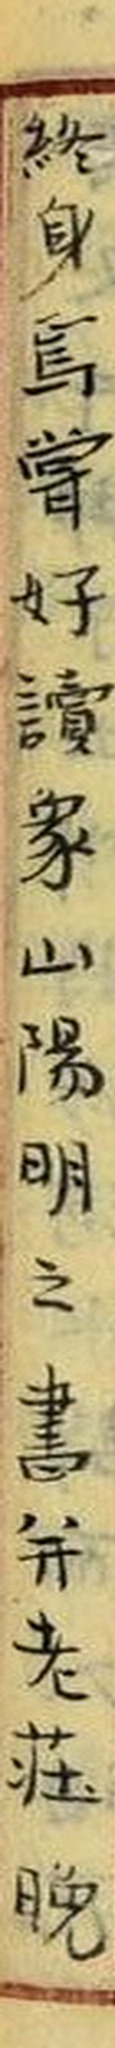終身焉甞好讀象山陽明之書并老荘晩
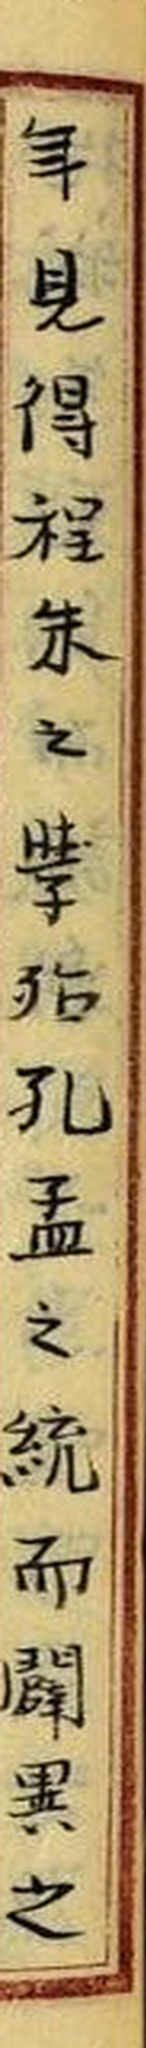年見得程朱之學殆孔孟之統而闢異之
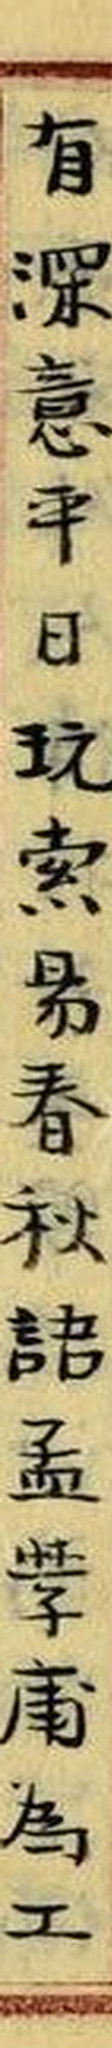有深意平日玩索易春秋語孟學庯為工
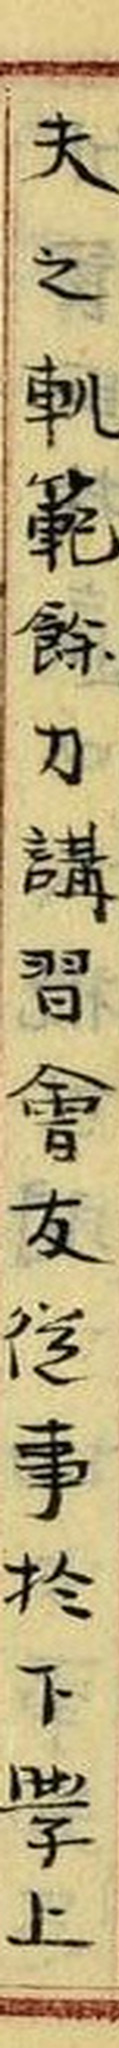夫之軋範餘力講習會友従事於下學上
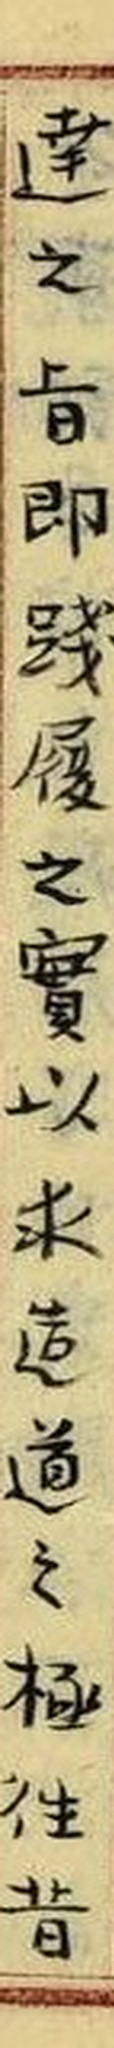達之㫖即踐履之實以求造道之極往昔
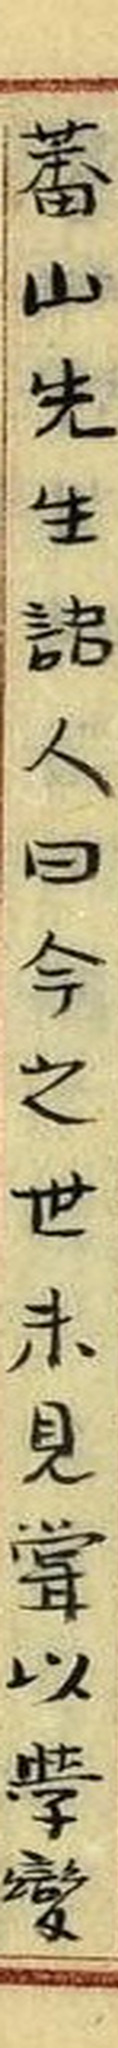蕃山先生語人曰今之世未見甞以學變
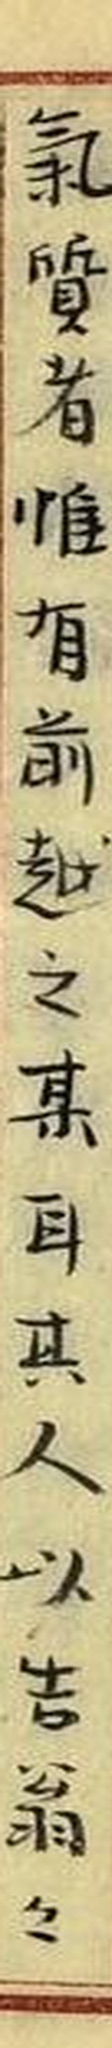氣質者惟有前越之某耳其人以告翁々
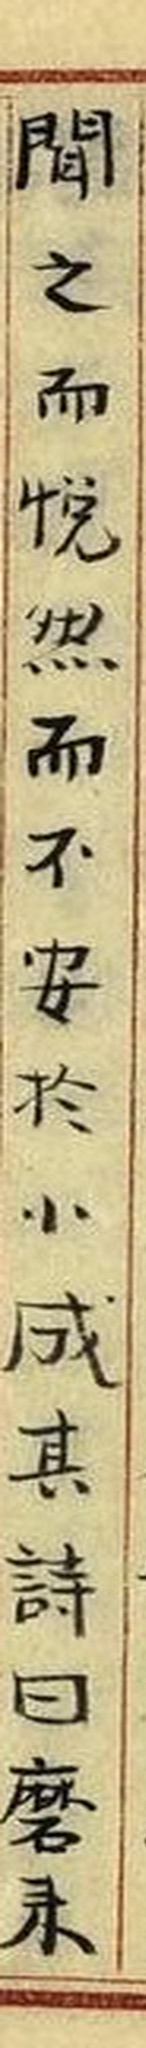聞之而悦然而不安於小成其詩曰磨来
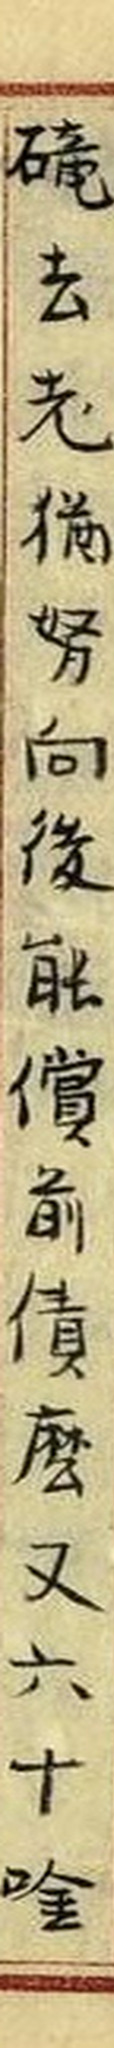去老猶努向後能償前債磨又六十唫
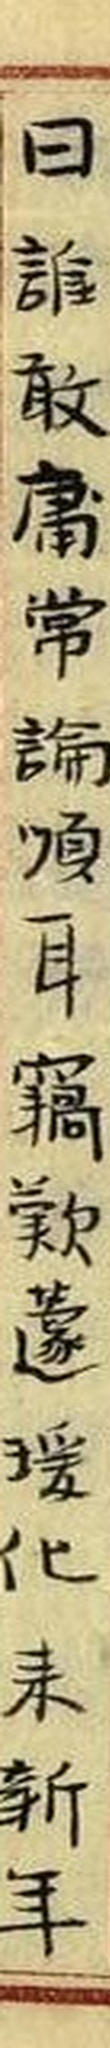曰誰敢庸常論順耳竊歎遽瑗化来新年
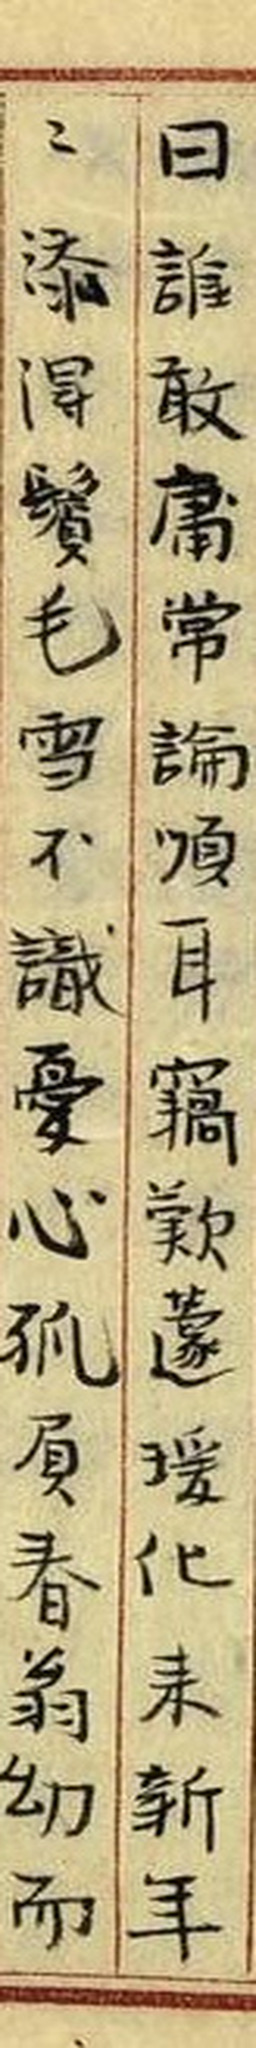々添得鬢毛雪不識憂心孤負春翁幼而
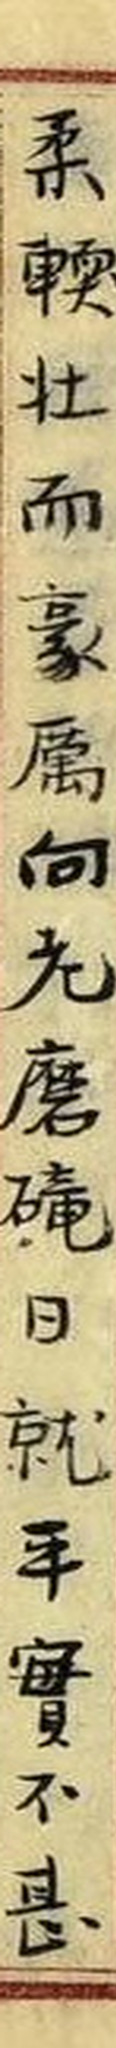柔輭壮而豪厲向老磨日就平實不甚
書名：温古集 四巻
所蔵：福井県文書館 Fukui Prefectural Archives
